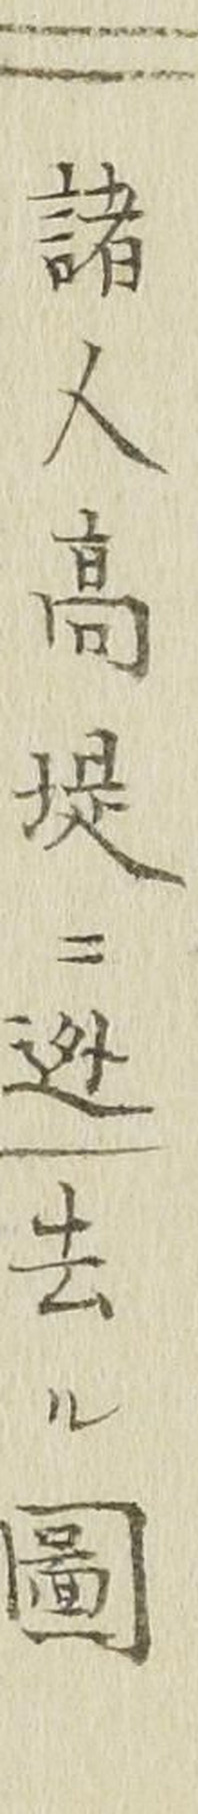諸人高堤ニ迯去ル図
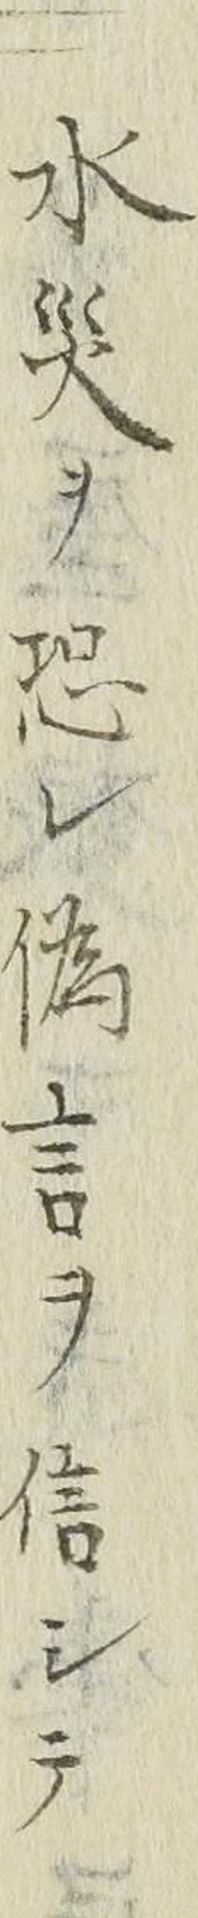水災ヲ恐レ偽言ヲ信シテ
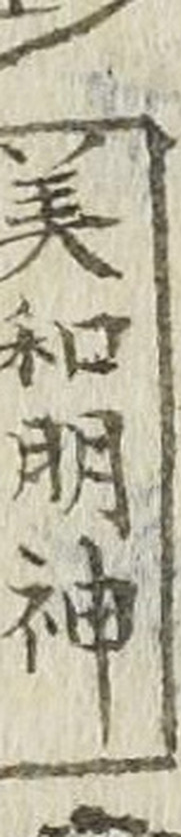美和明神
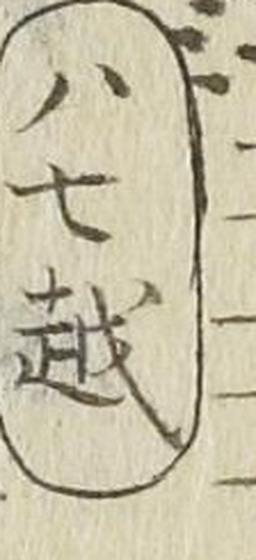八七越
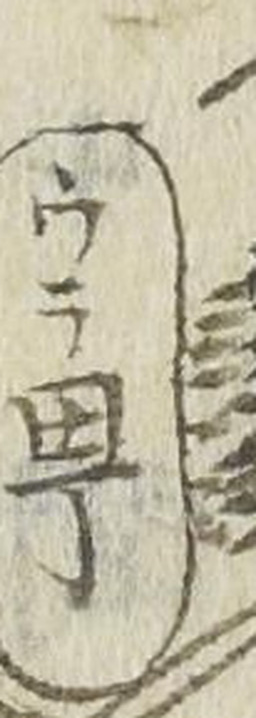ウラ町

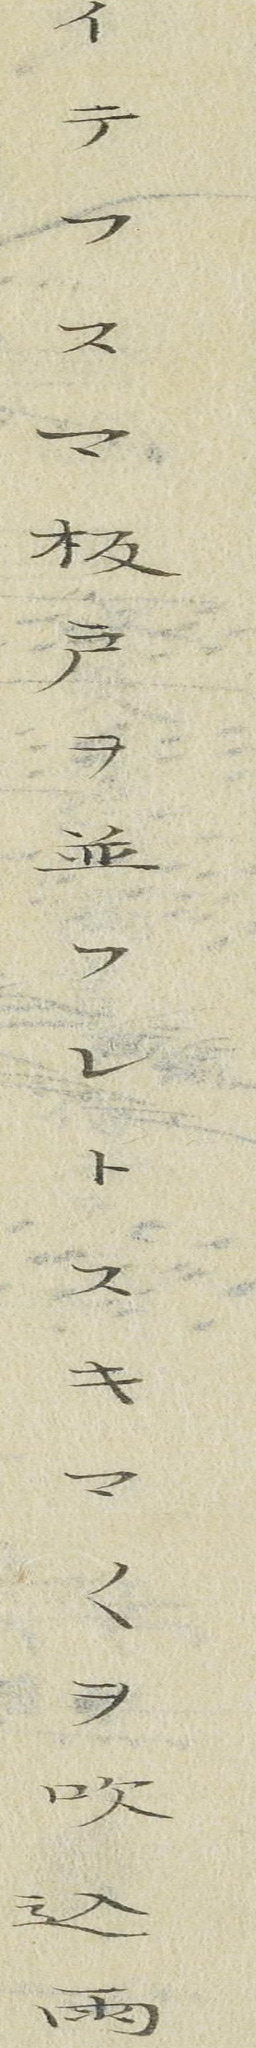イテフスマ板戸ヲ並フレトスキマ〱ヲ吹込雨
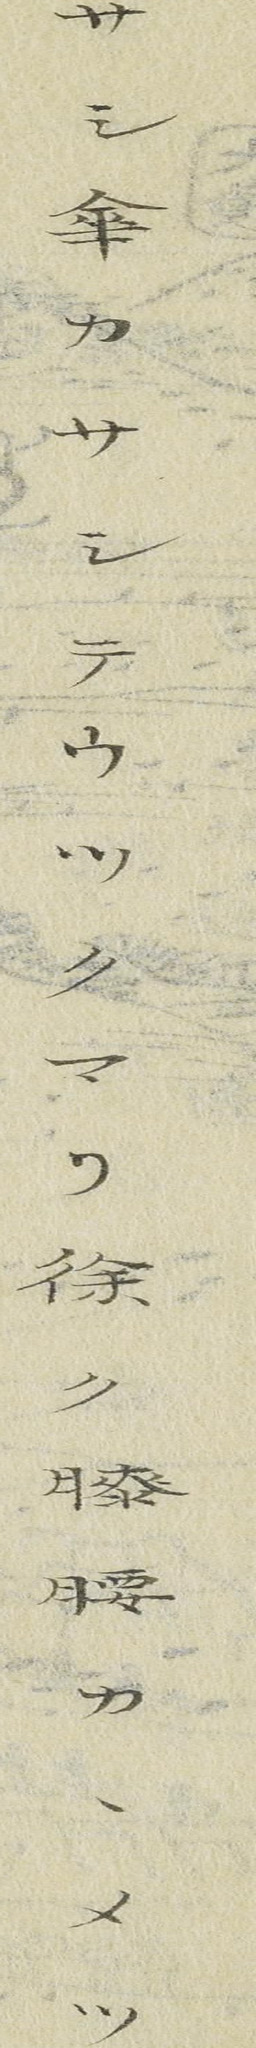サシ傘カサシテウツクマリ徐ク膝腰カヽメツ
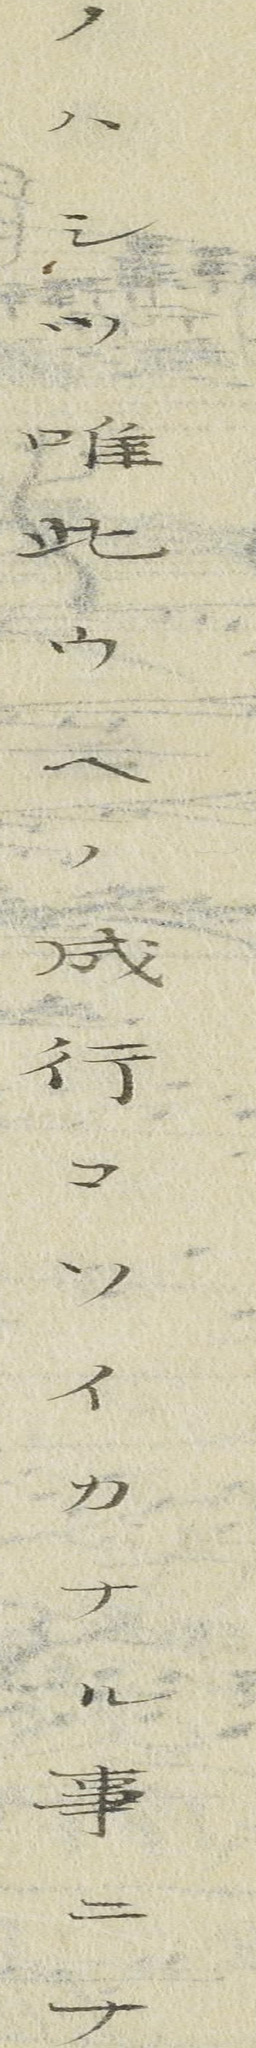ノハシツ唯此ウヘノ成行コソイカナル事ニナ
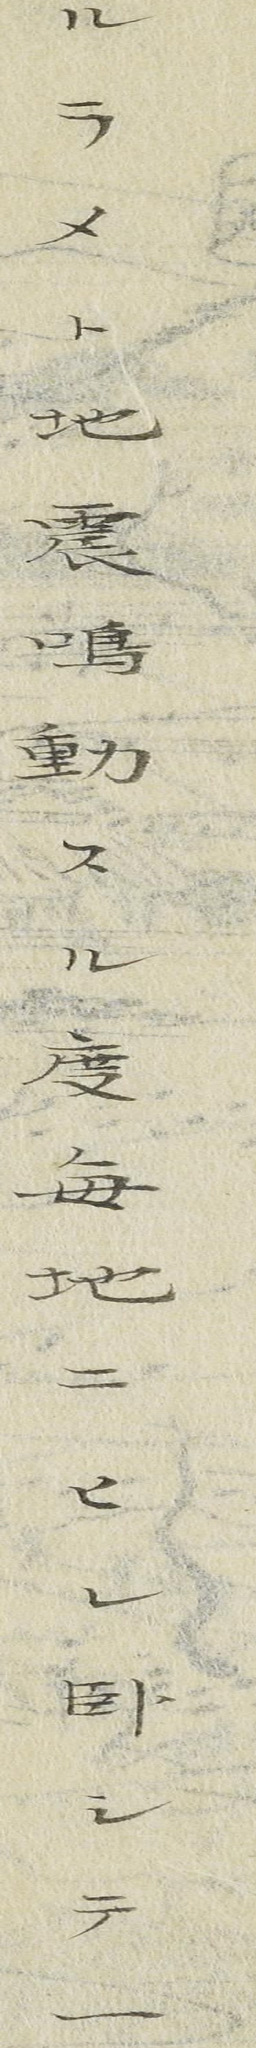ルラメト地震鳴動スル度毎地ニヒレ臥シテ一
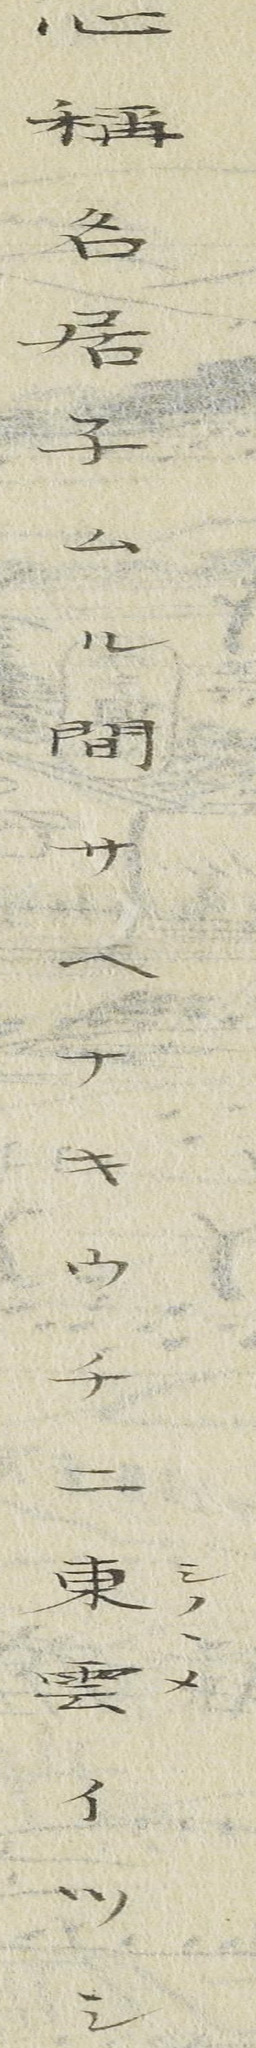心称名居子ムル間サヘナキウチニ東雲イツシ
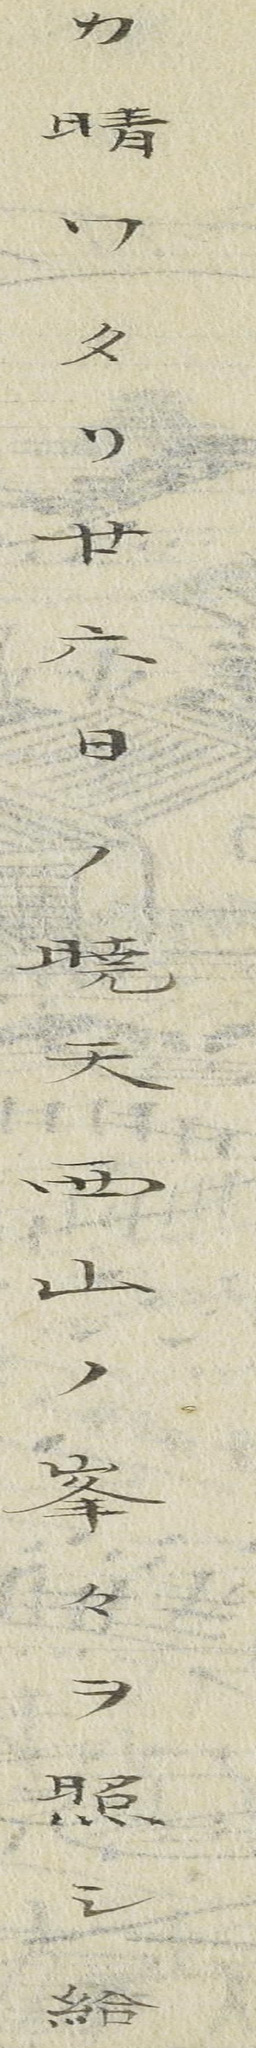カ晴ワタリ廿六日ノ暁天西山ノ峯々ヲ照シ給
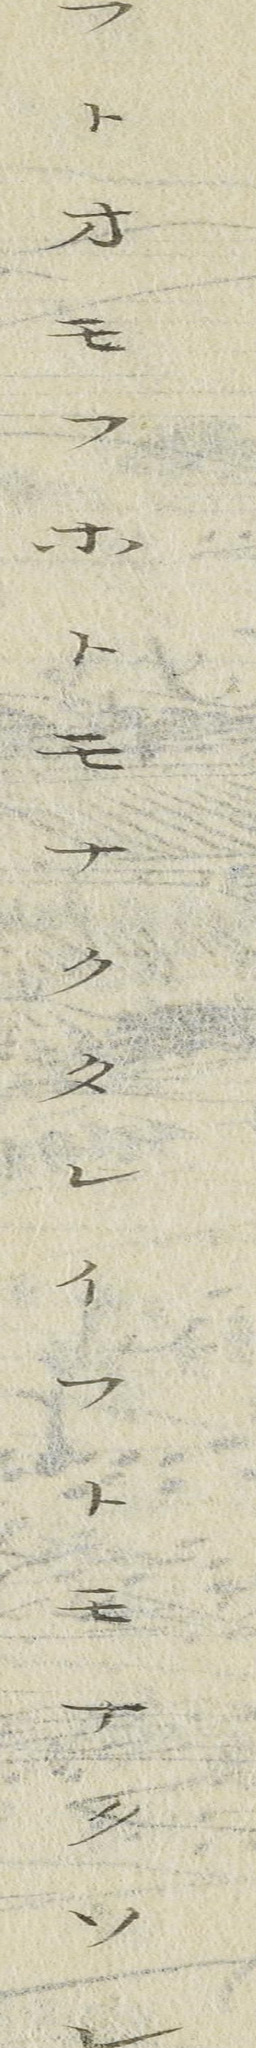フトオモフホトモナクタレイフトモナクソレ
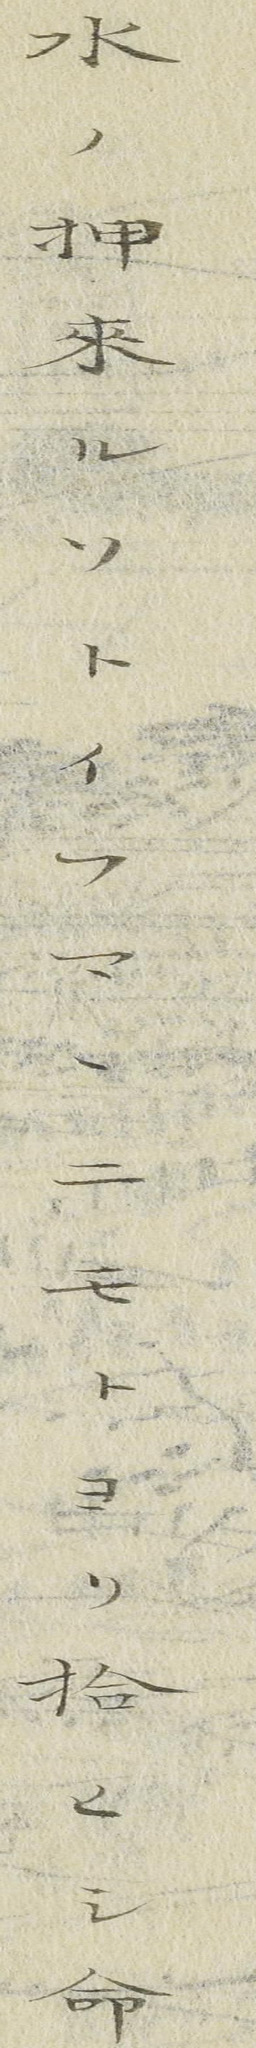水ノ押来ルソトイフマヽニモトヨリ拾ヒシ命
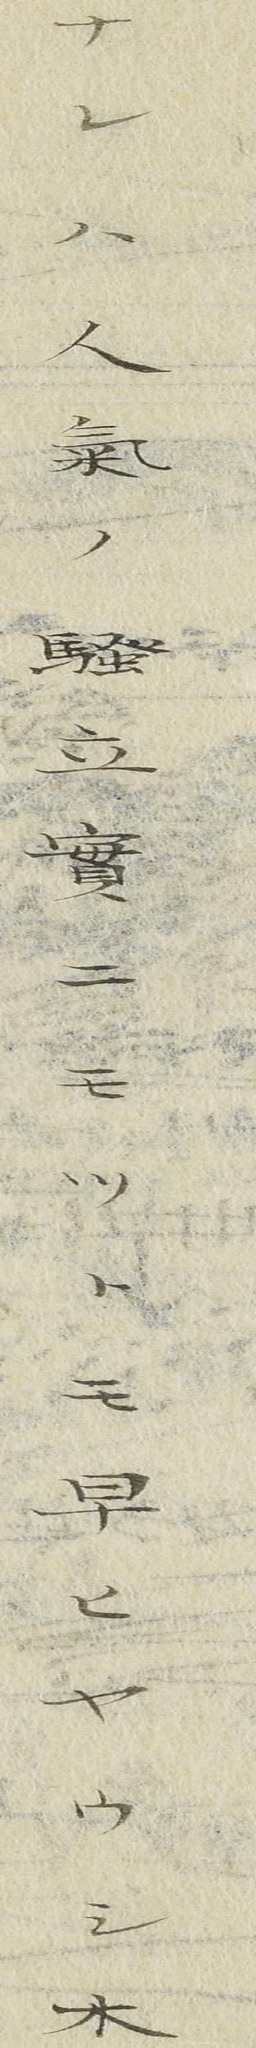ナレハ人気ノ騒立実ニモツトモ早ヒヤウシ木
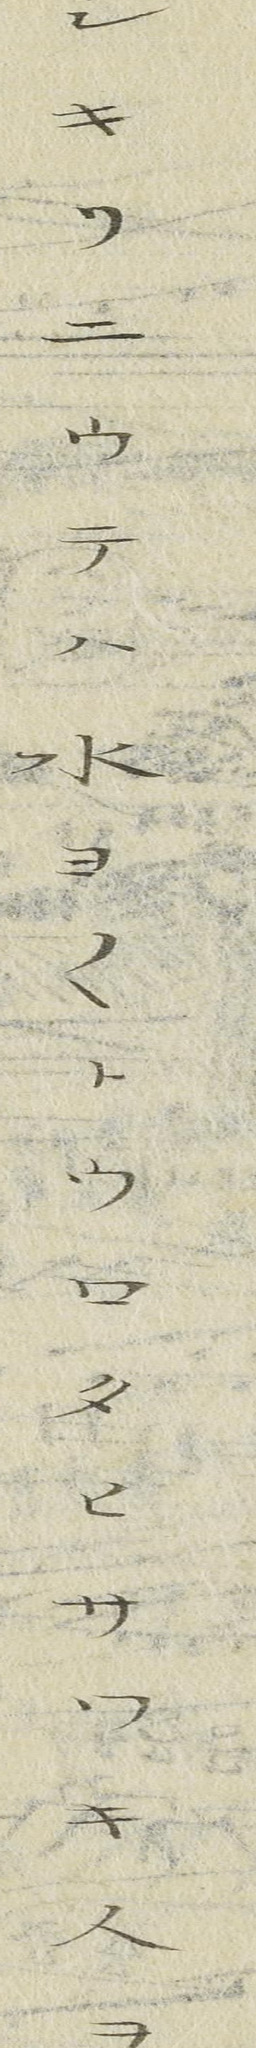シキリニウテハ水ヨ〱トウロタヒサワキ人ヲ
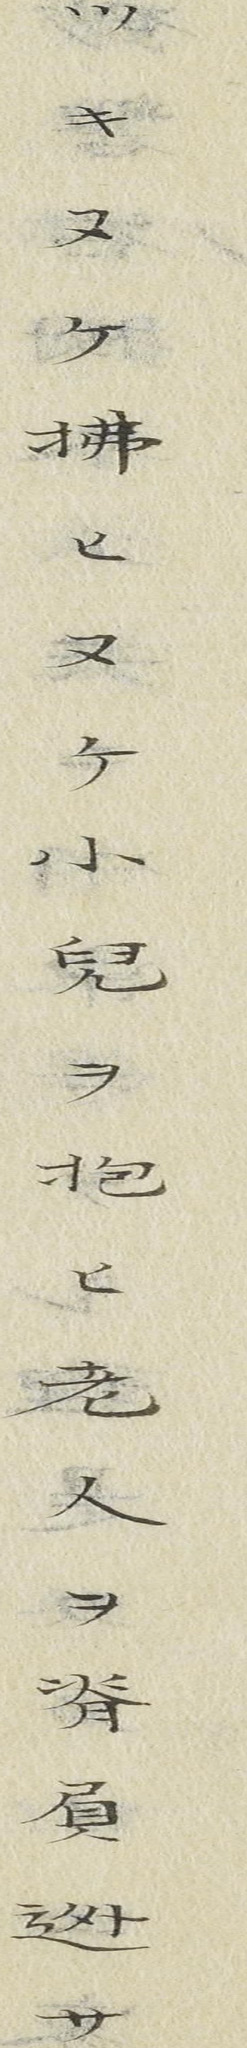ツキヌケ払ヒヌケ小児ヲ抱ヒ老人ヲ背負迯サ
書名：地災撮要　地震之部　巻ノ二
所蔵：東京大学地震研究所図書室 Earthquake Research Institute Library, The University of Tokyo, JAPAN
